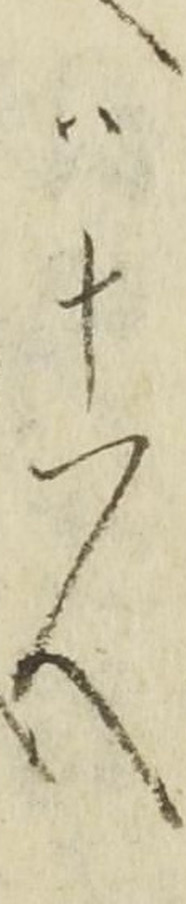同廿一人
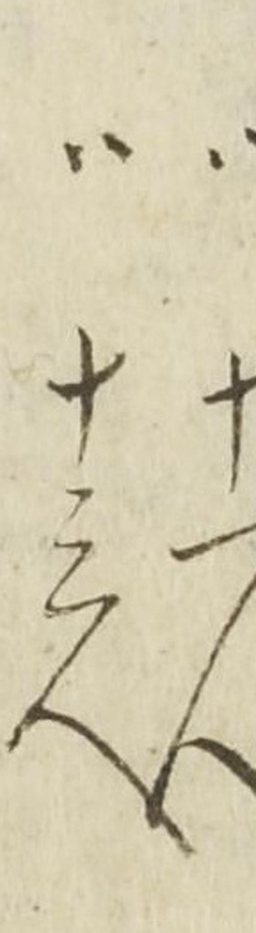同十三人
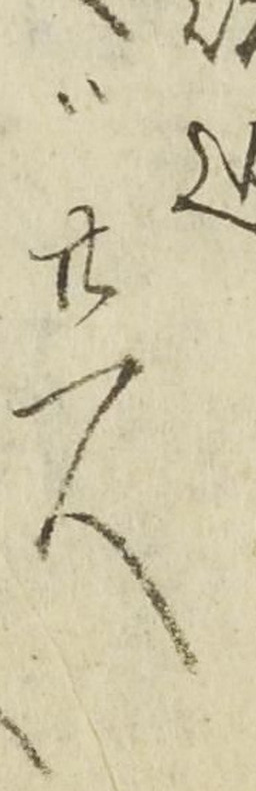同廿一人
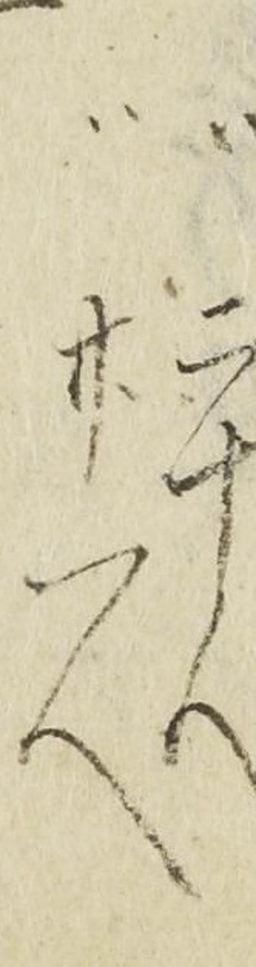同廿一人
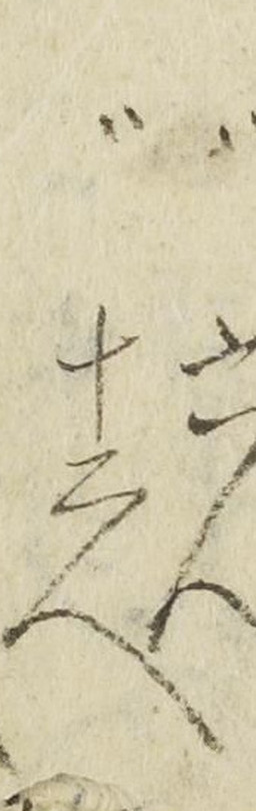同十三人
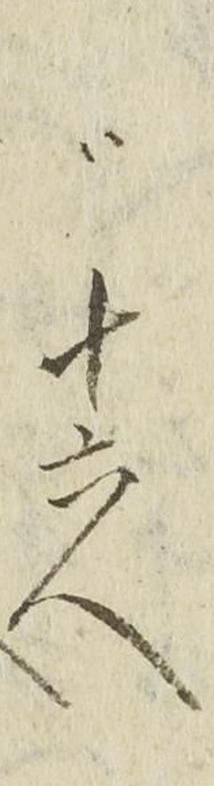同十三人
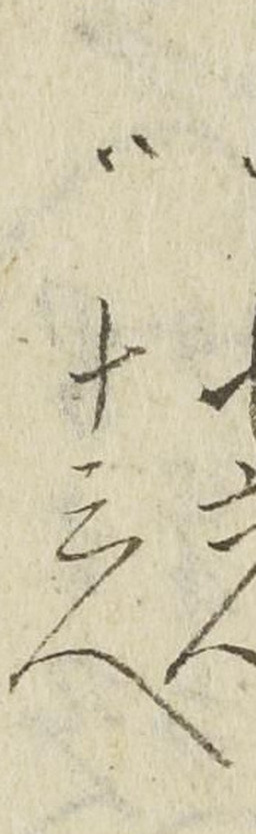同十三人
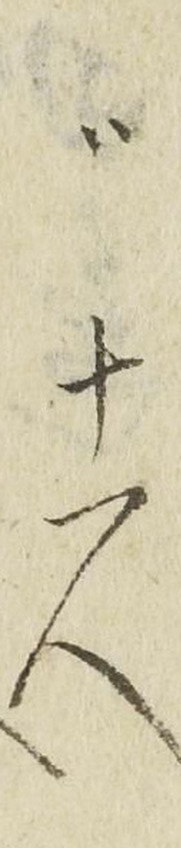同廿一人
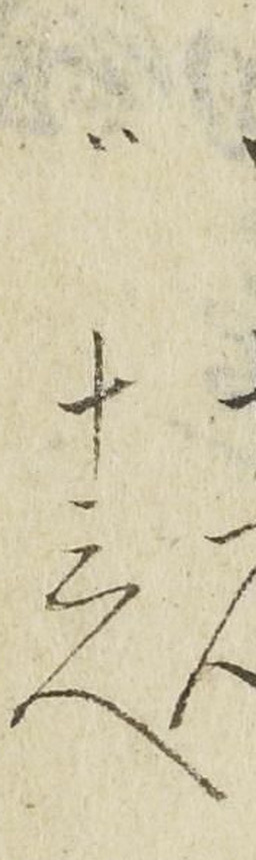同十三人
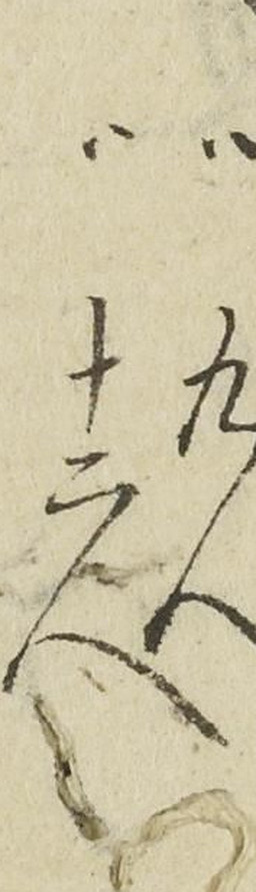同十三人

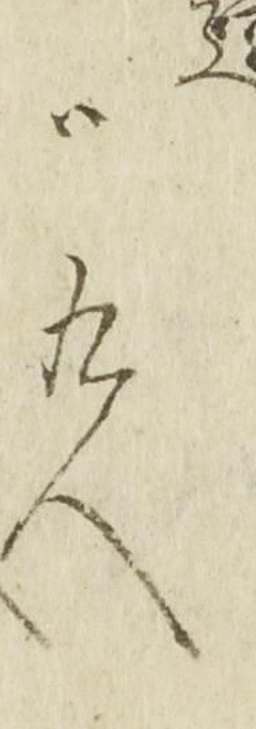同六人
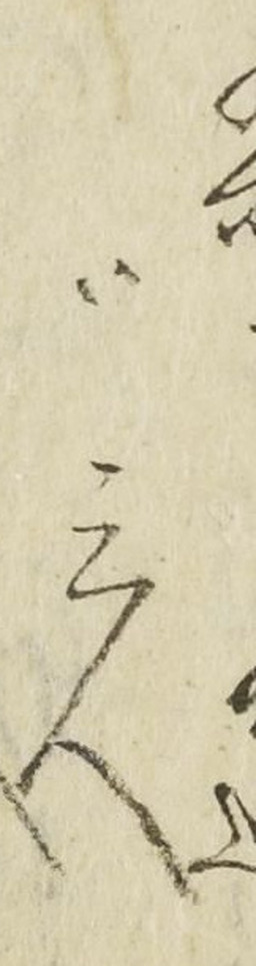同六人
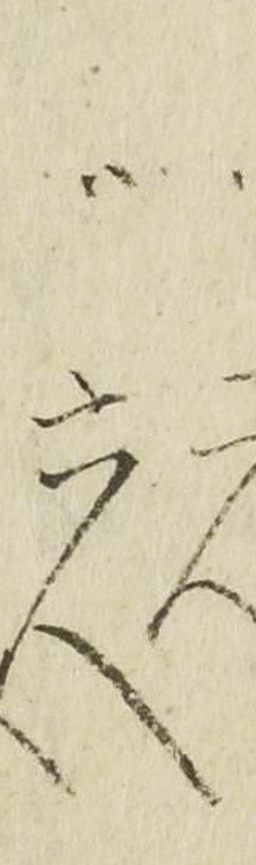同六人
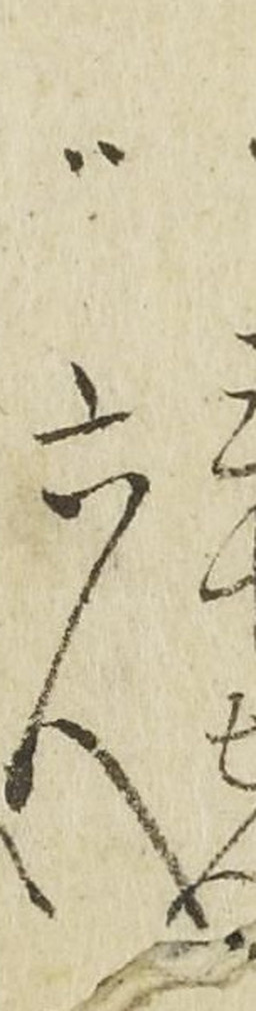同六人
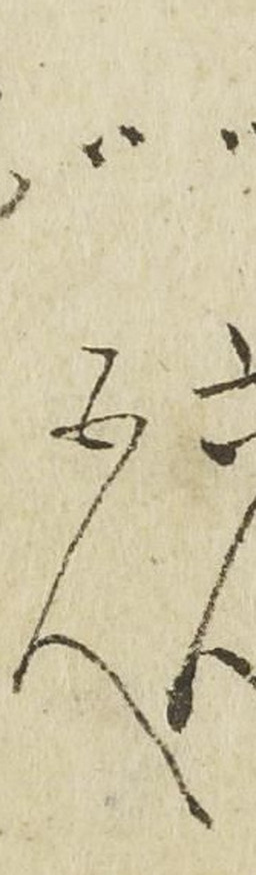同六人
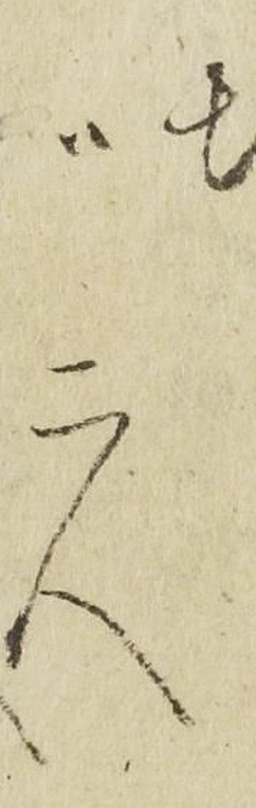同六人
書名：安政二乙卯年十月二日大地震之事
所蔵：東京大学地震研究所図書室 Earthquake Research Institute Library, The University of Tokyo, JAPAN
